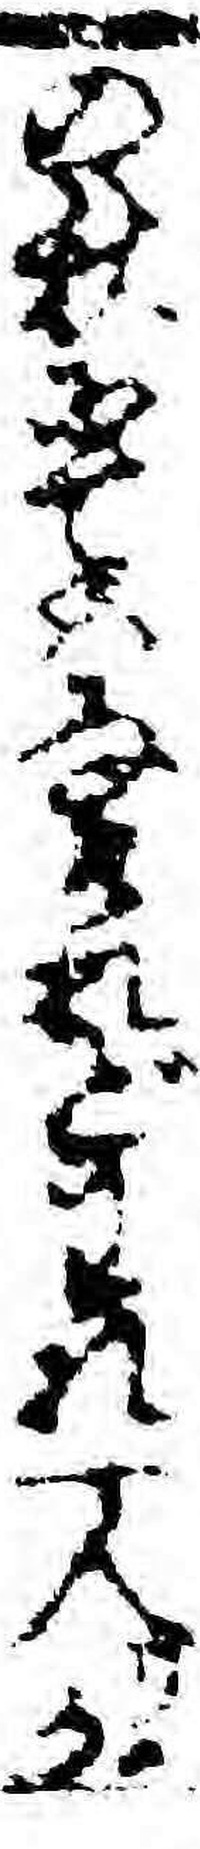の秋にてはなけれどわれ一人りが
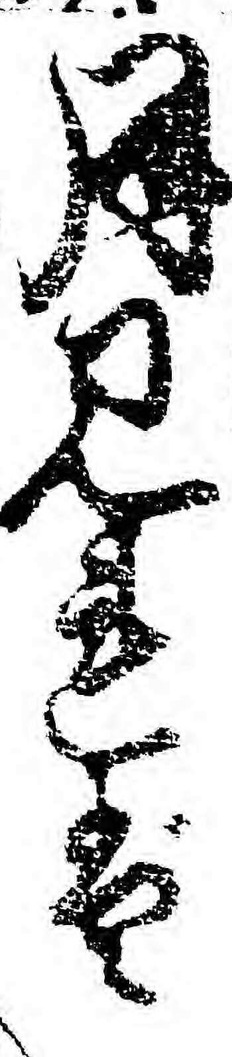月見れば
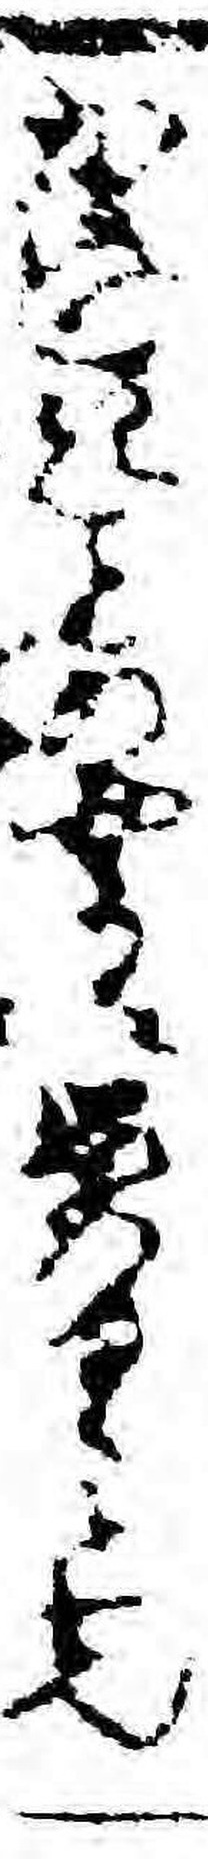かなしきことのやうに思はるゝと也
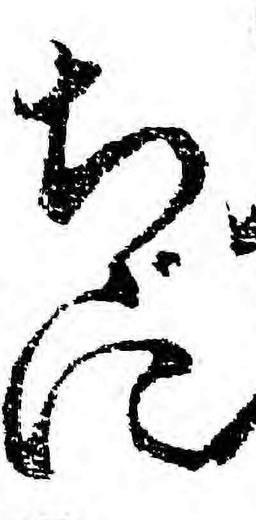ちゞに
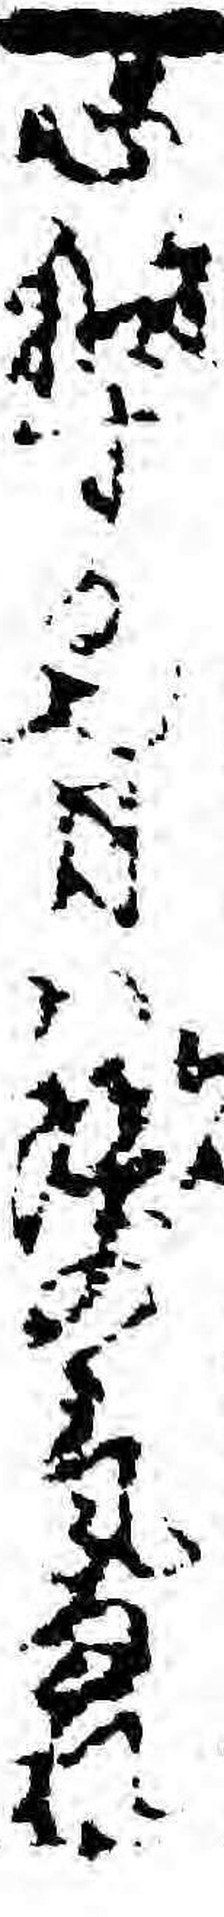心和する也月は陰の気なれ
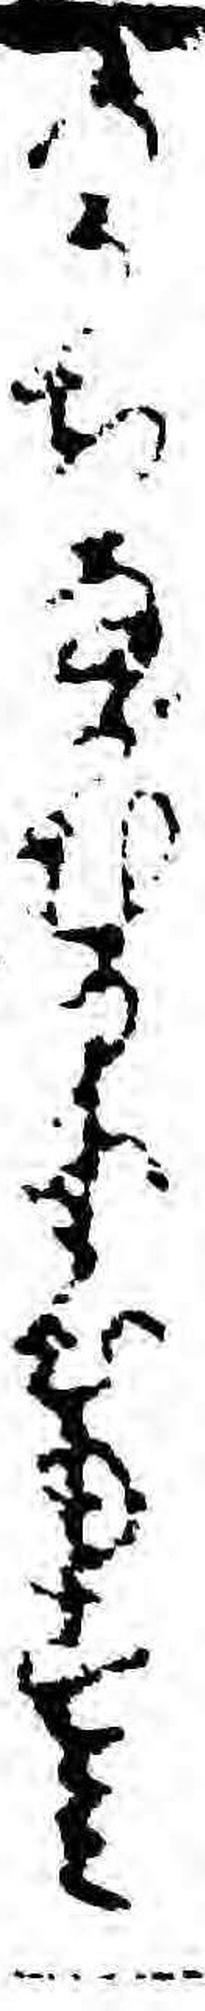はうちながむるに心もすみ
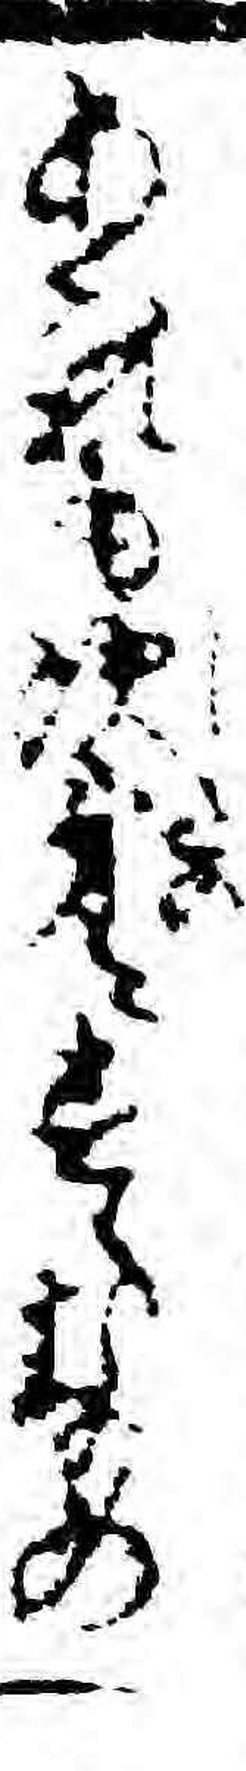あはれも次第にすゝむもの
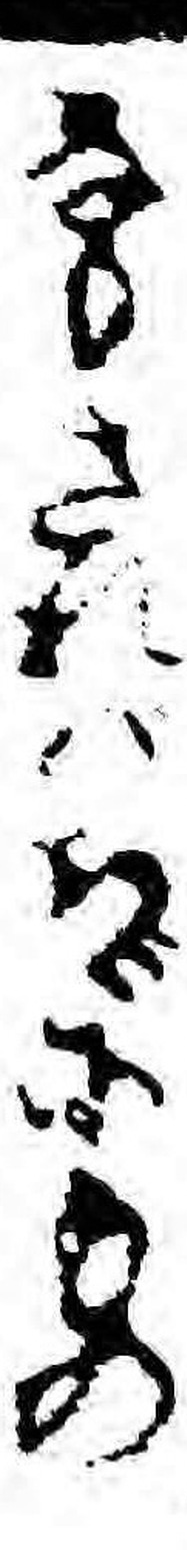なりさればちゞにもの
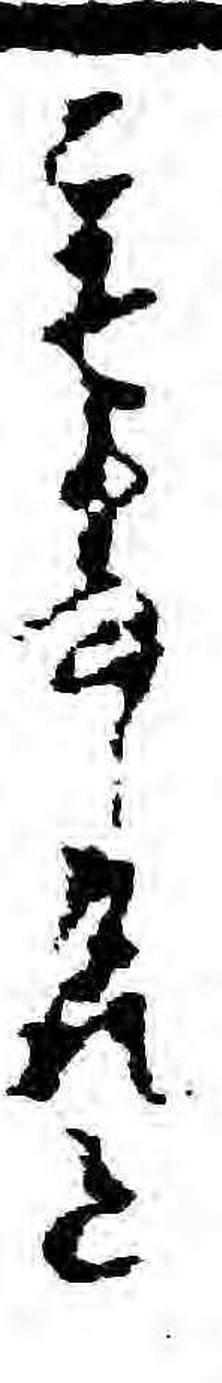こそかなしけれと
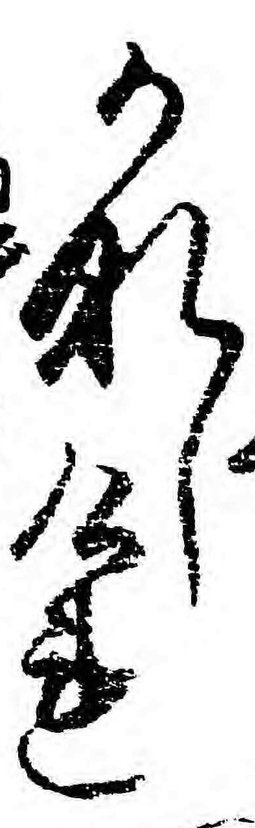かなしけれ
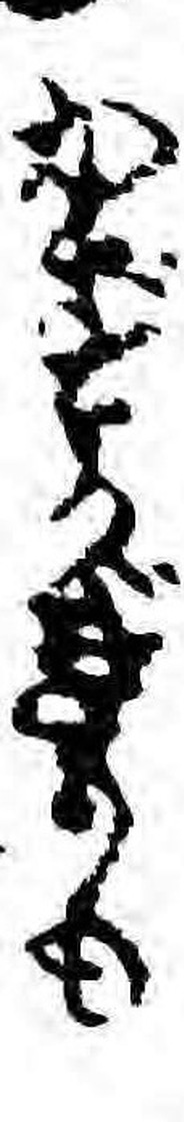かずかぎりも
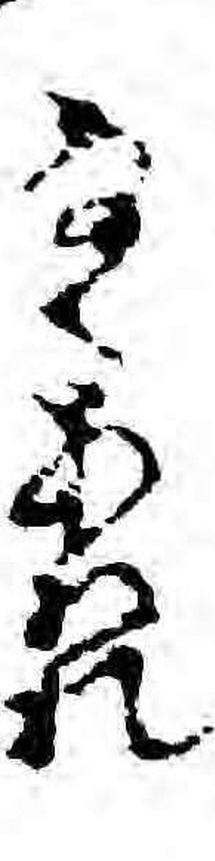なくあはれ
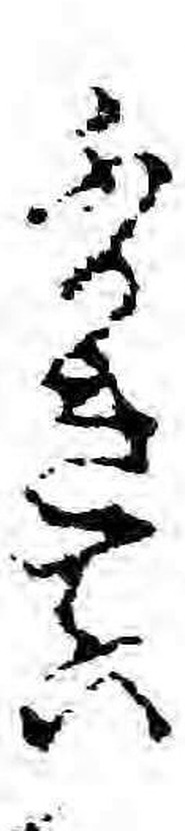ふかきてい
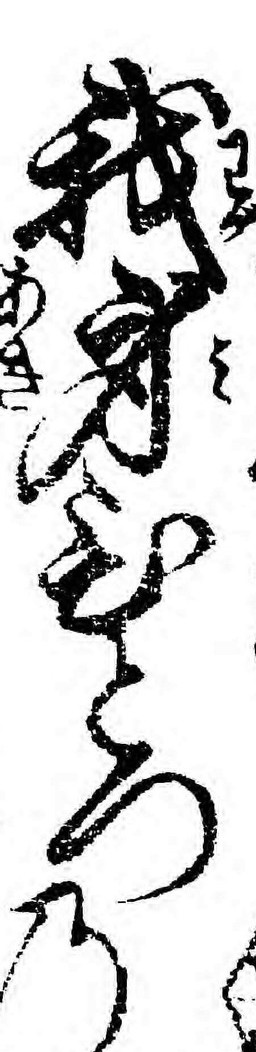我身ひとつの
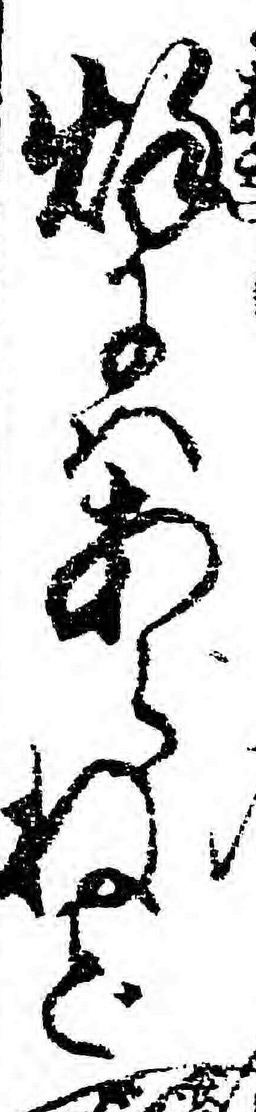秋にはあらねど

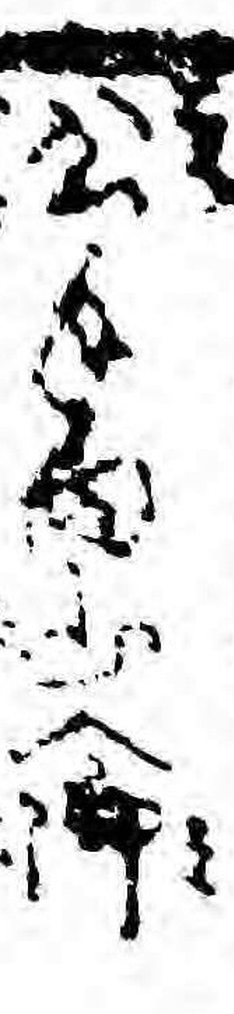公手向山へ御
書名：頭書和歌注譯／壽賀多百人一首小倉錦
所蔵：国文学研究資料館
